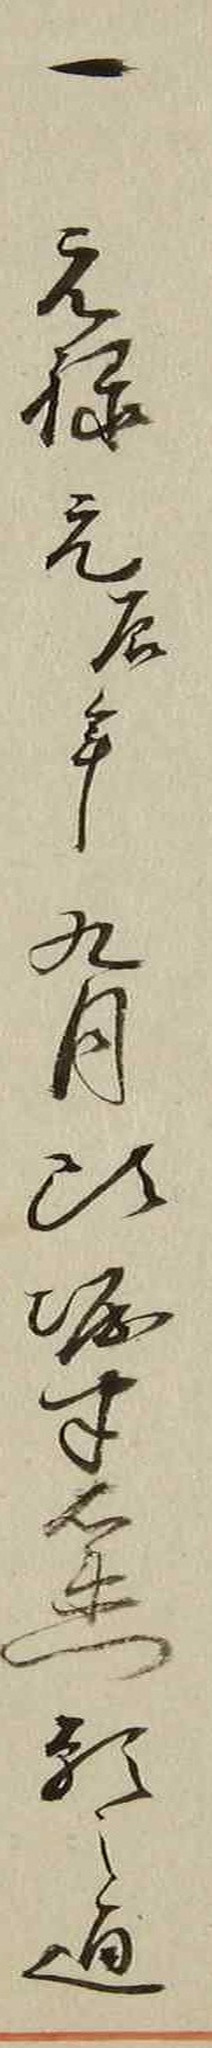一元禄元辰年九月頭堀半右衛門願之通
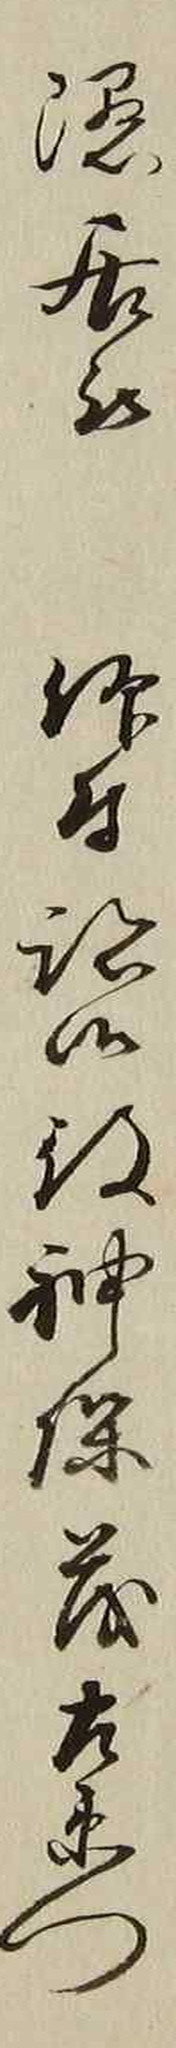隠居被仰付跡御役神保茂左衛門
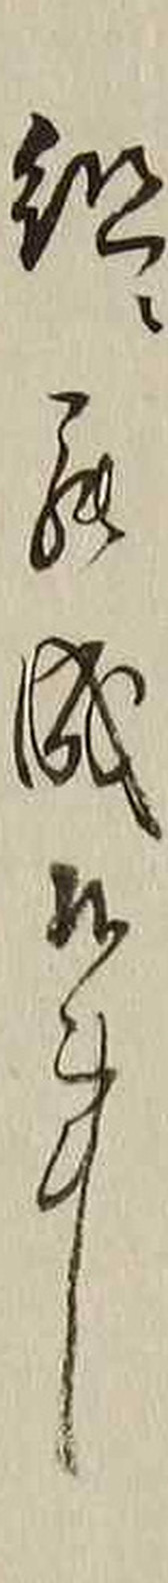組に罷成候事
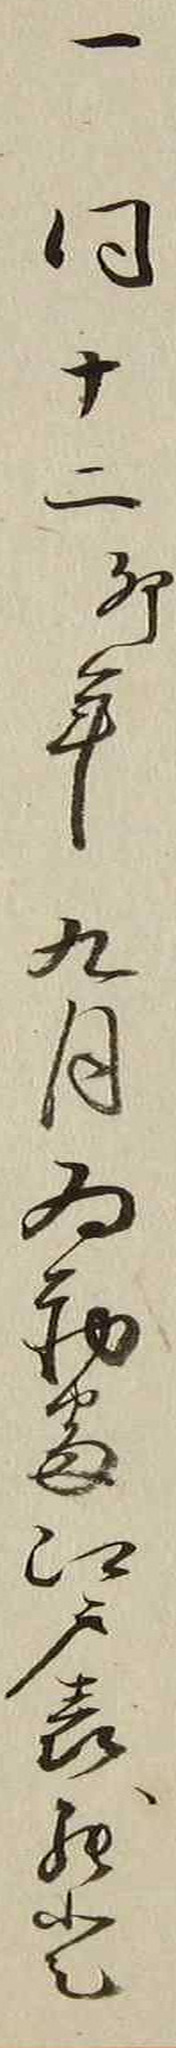一同十二卯年九月為勤番江戸表へ罷登
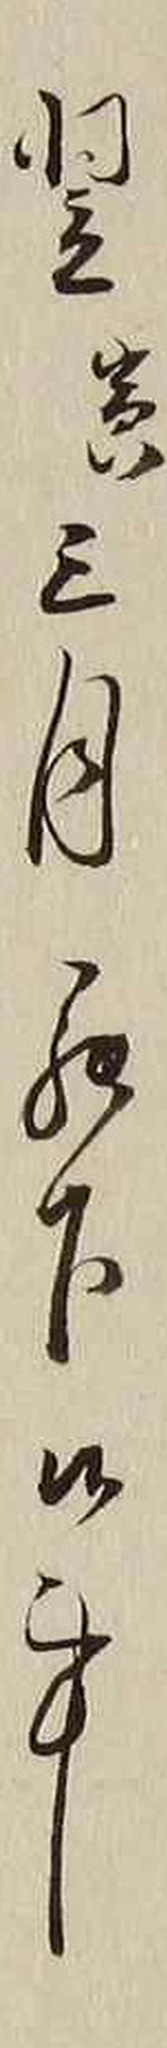翌寅三月罷下候事
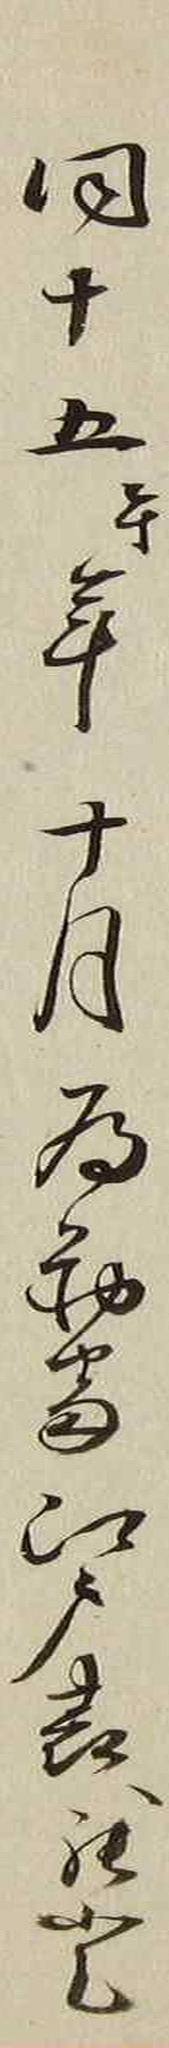一同十五午年十月為勤番江戸表へ罷登
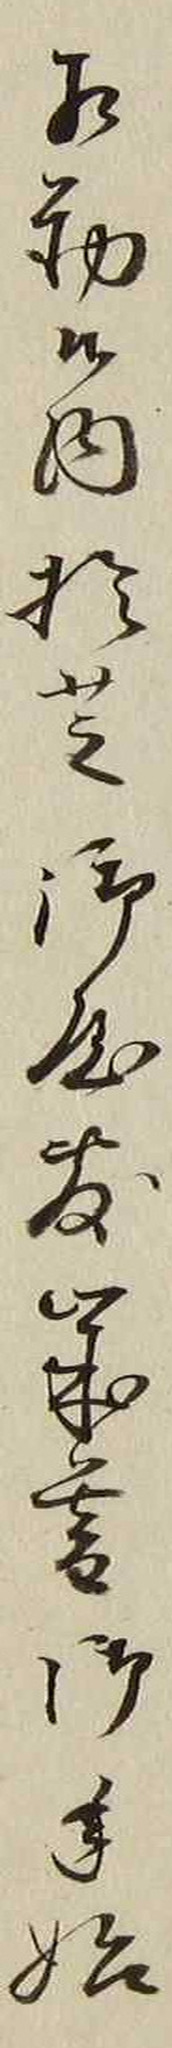相勤候内於芝御屋敷歳暮御手始
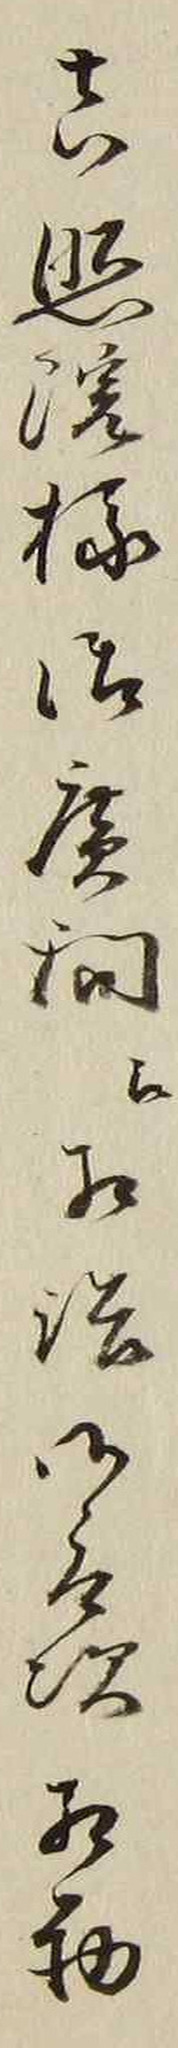真照院様御広間へ相詰御取次相勤
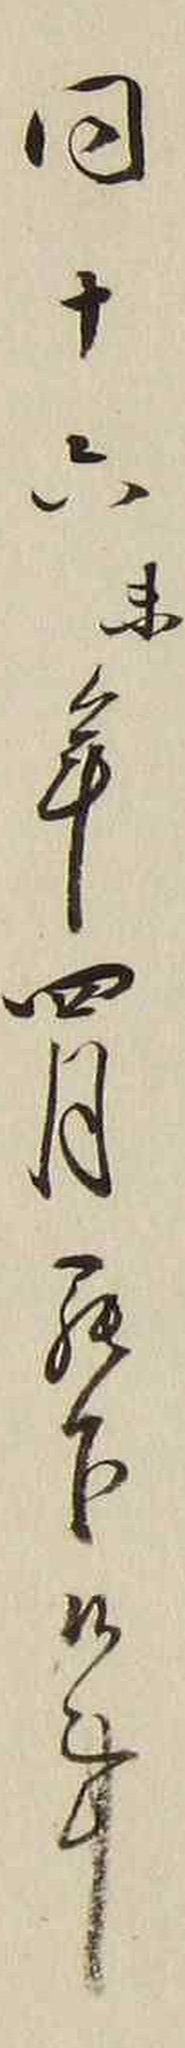同十六未年四月罷下候事
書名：諸士系譜　巻之170　な之部12
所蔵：会津若松市立会津図書館
